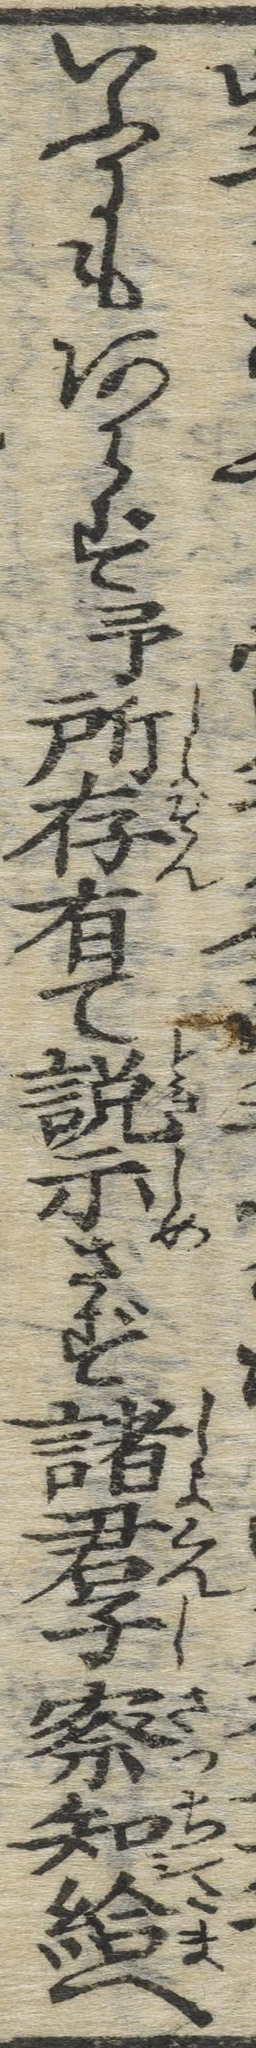いふるもあらず予所存有て説示さず諸君子察知給へ
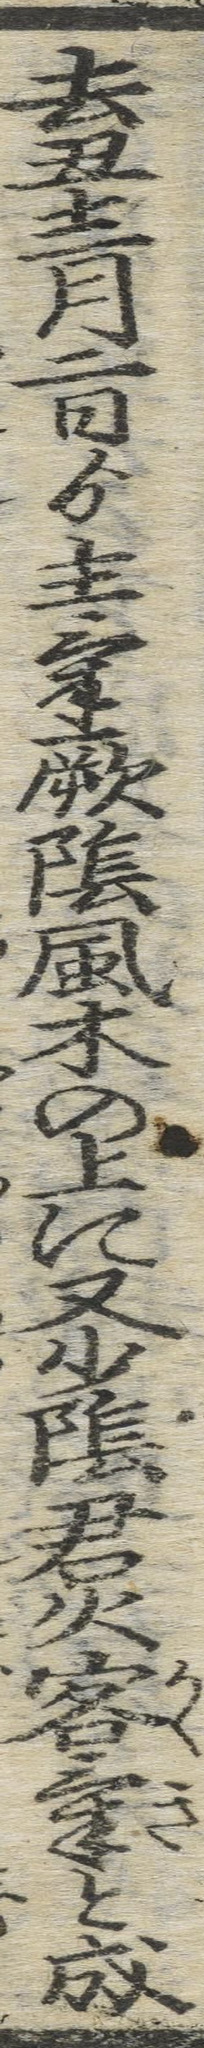去丑十二月二日ゟ主気厥陰風木の上に又少陰君火客気と成
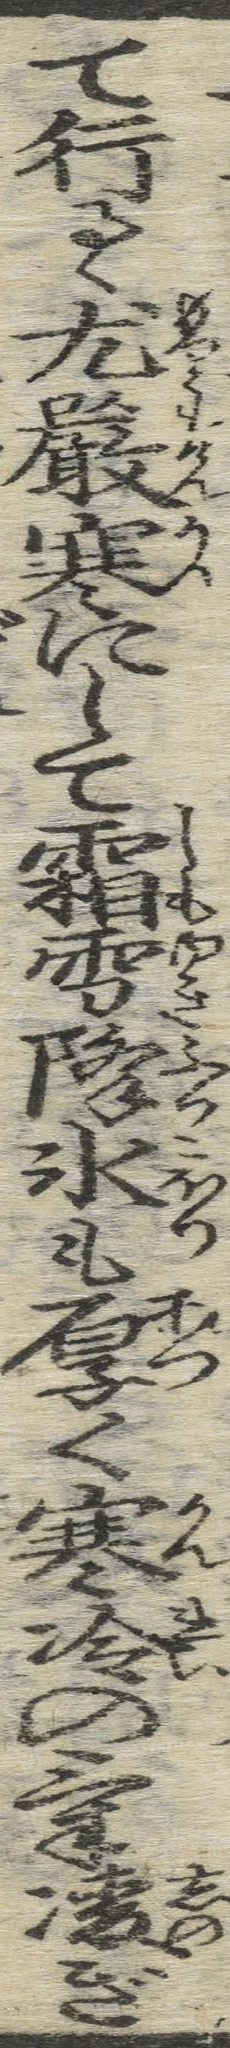て行るゝ尤嚴寒にして霜雪降氷も厚く寒冷の気凌ぎ
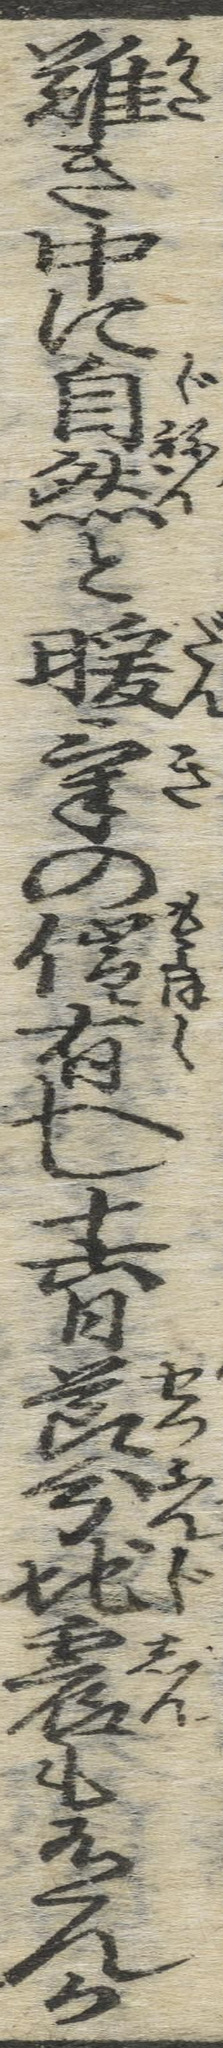難き中に自然と暖気の催有へし十六日節分地震も有んか
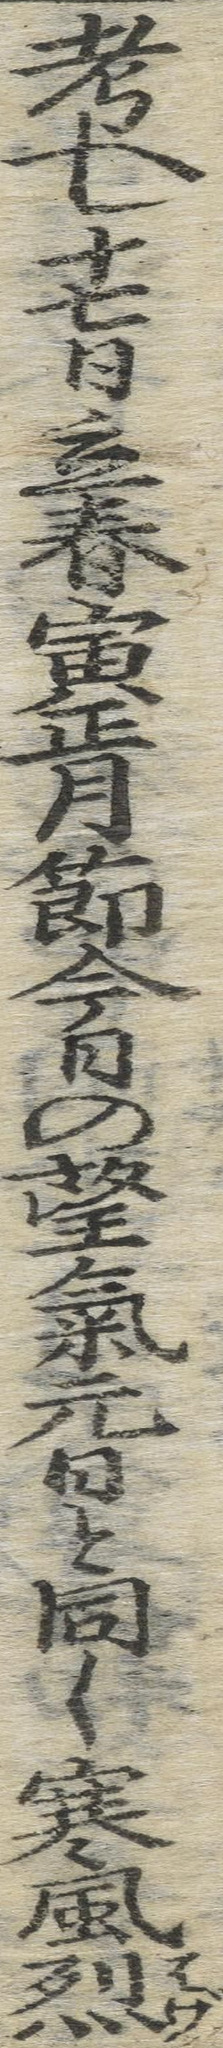考へし十七日立春寅正月節今日の望気元日と同し寒風烈
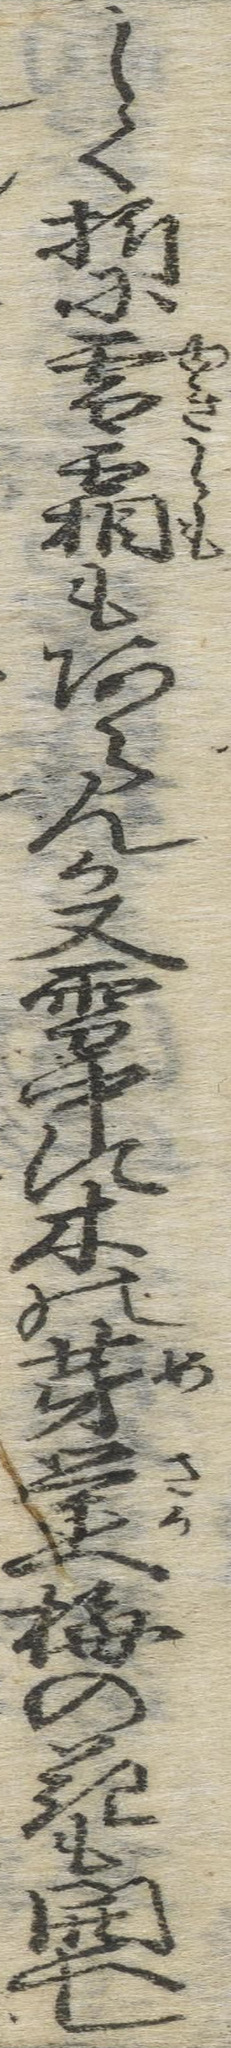しく折に雪霜もあらんか又雪中に木の芽栄へ梅の花も開へし
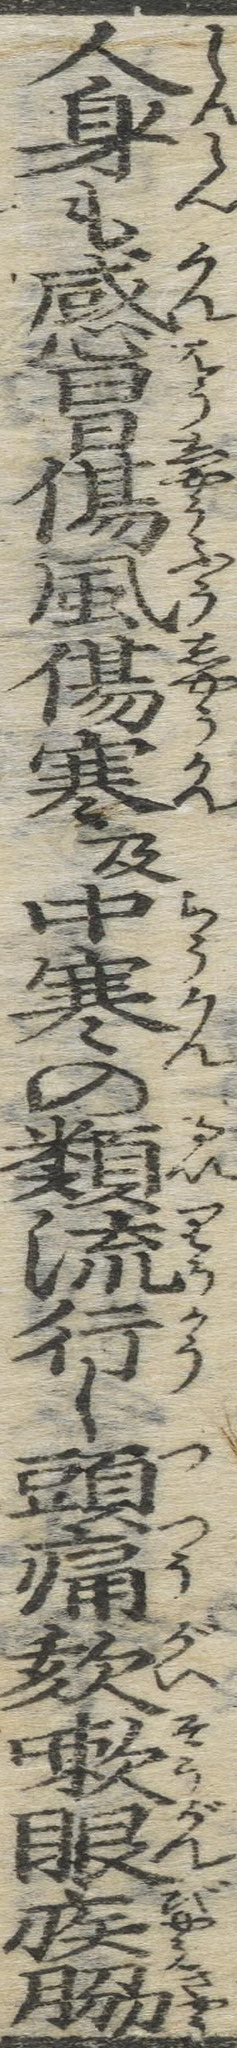人身も感冒傷風傷寒及中寒の類流行し頭痛欬嗽眼疾脇
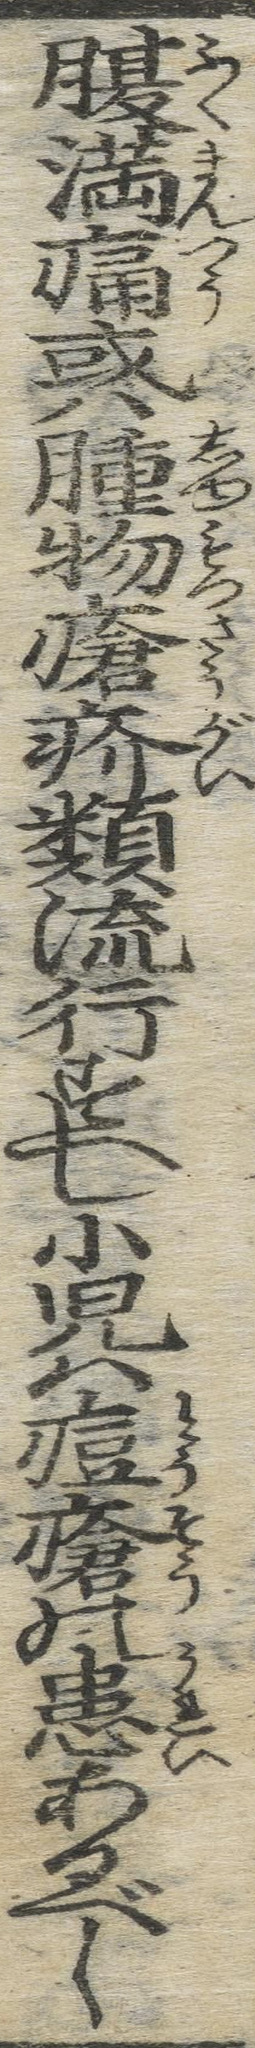腹満痛或は腫物瘡疥類流行すへし小児は痘瘡に患あるべし
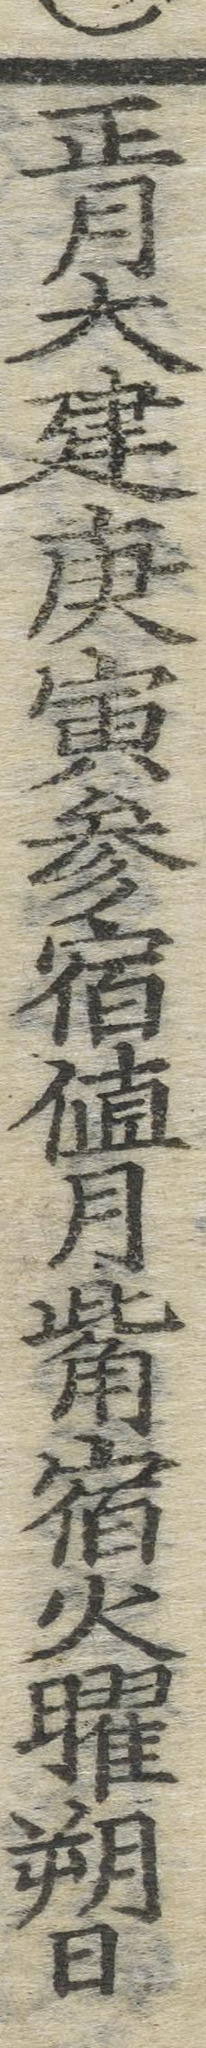正月大建庚寅参宿値月觜宿火曜朔日
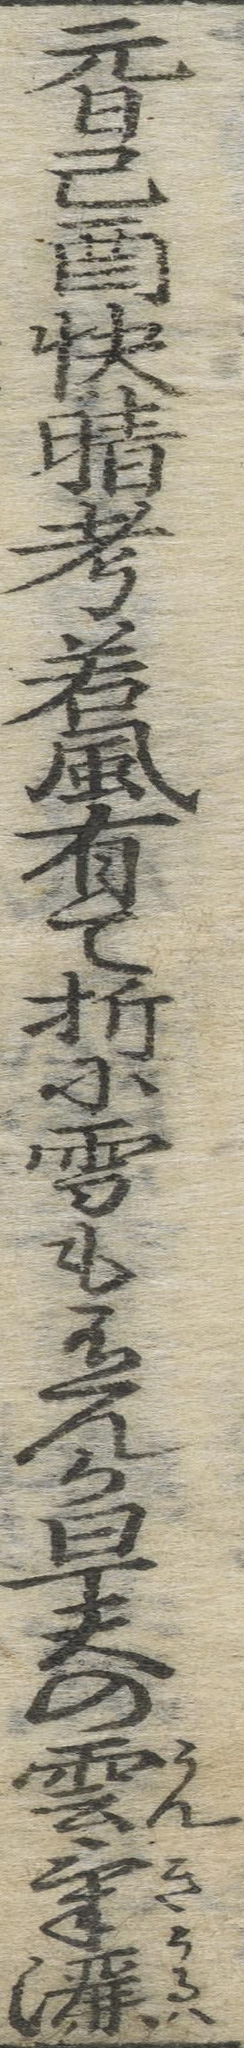元日己酉快晴考若風有て折に雪も有んか早天の雲気濂
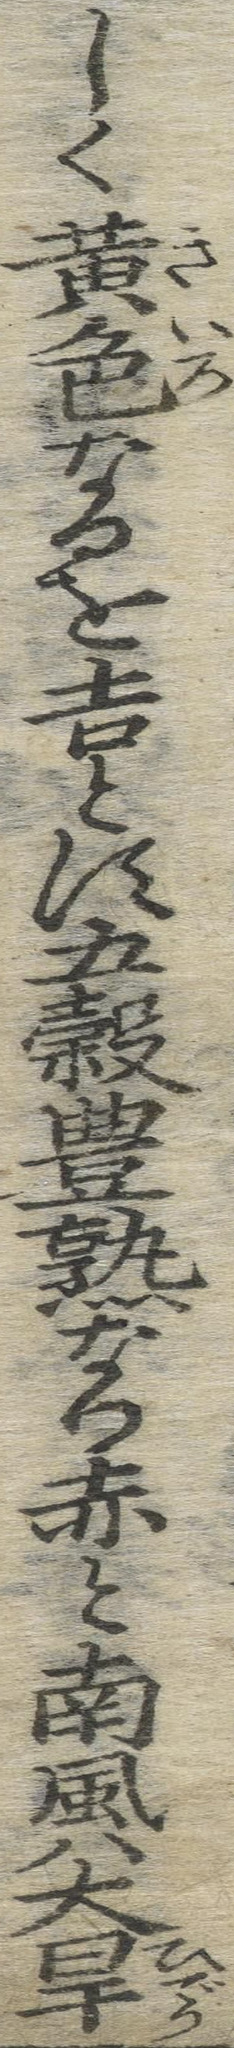しく黄色なるを吉とす五穀豊熟なり赤と南風は大旱

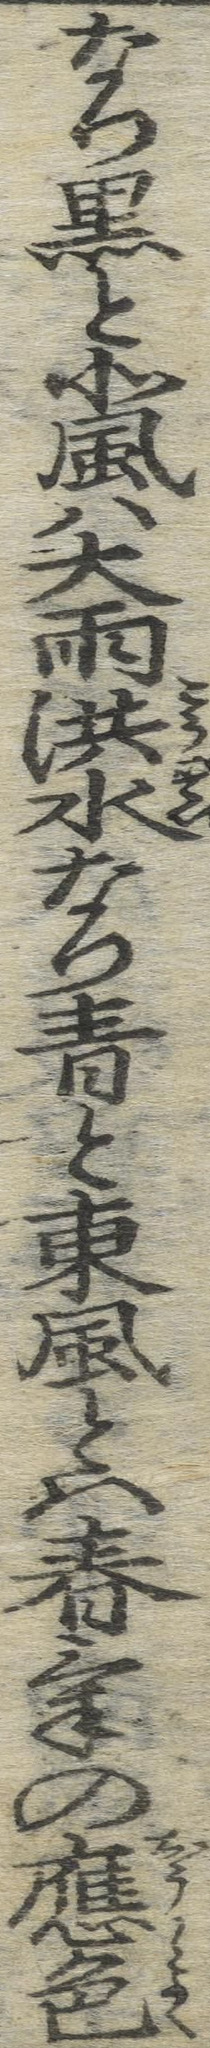なり黒と北風は大雨洪水なり青と東風とは春気の應色
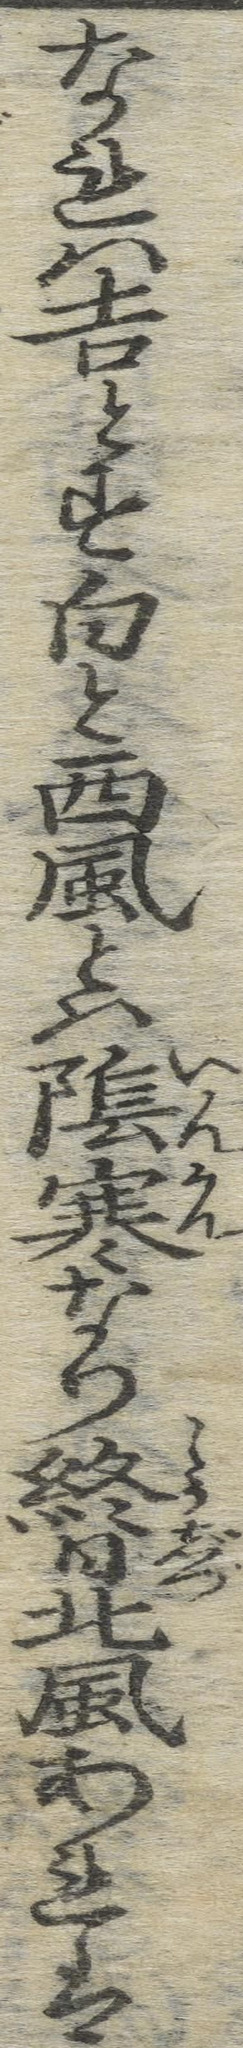なれは吉とす白と西風とは陰寒なり終日北風あれは
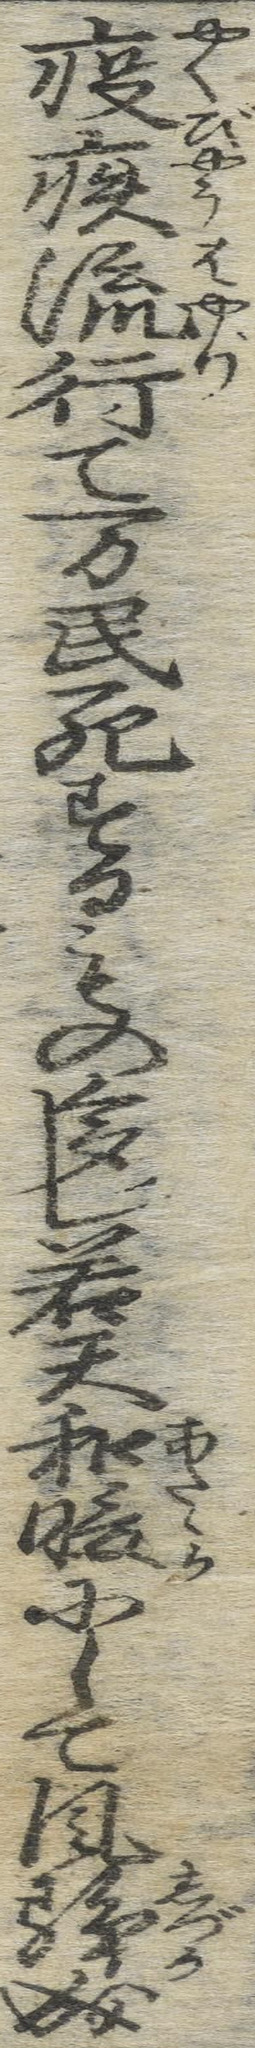疫疾流行て万民死することの多し若天和暖にして風静成
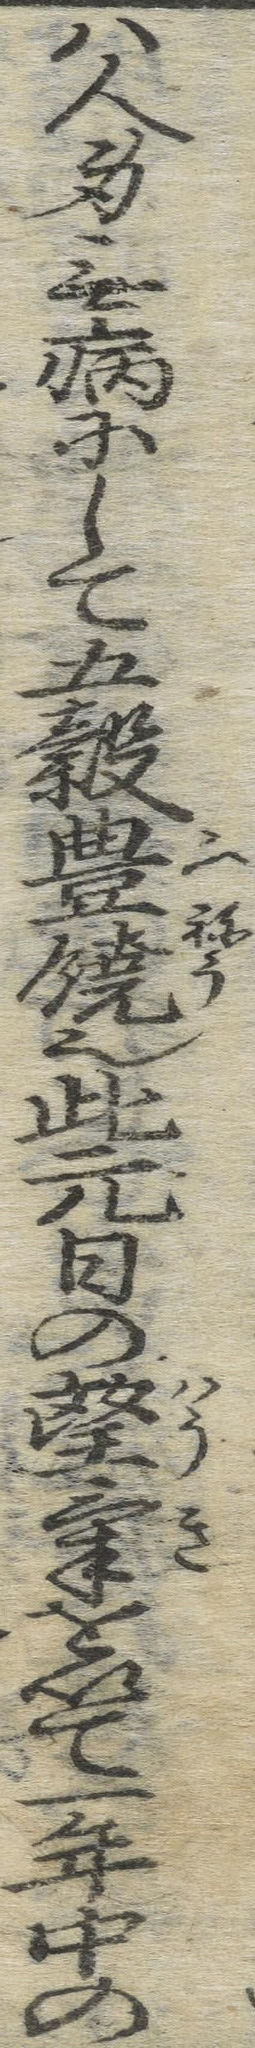は人身無病にして五穀豊饒也此元日の望気を以て一年中の
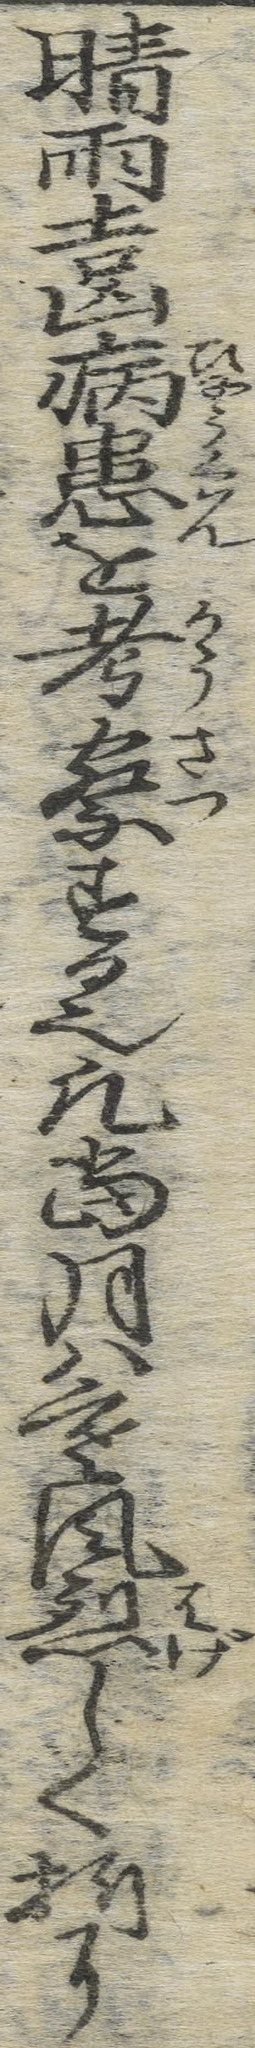晴雨吉凶病患を考察する也凡当月は寒風烈しく折に
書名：[晴雨考]
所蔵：東京大学地震研究所図書室 Earthquake Research Institute Library, The University of Tokyo, JAPAN
